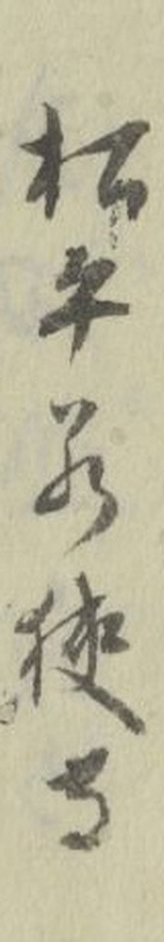同断松平若狭守
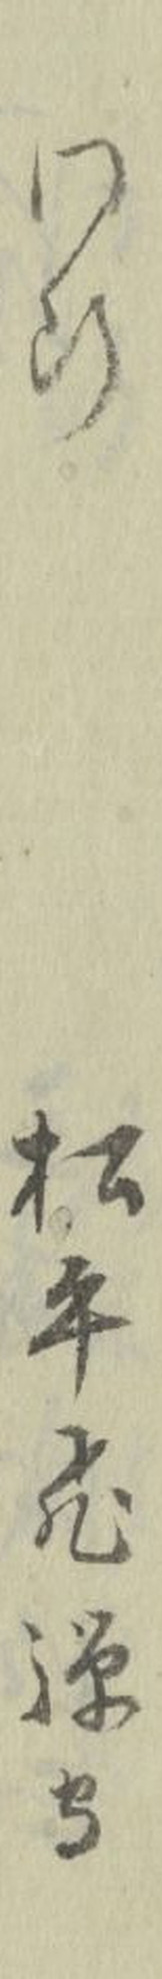同断松平飛騨守
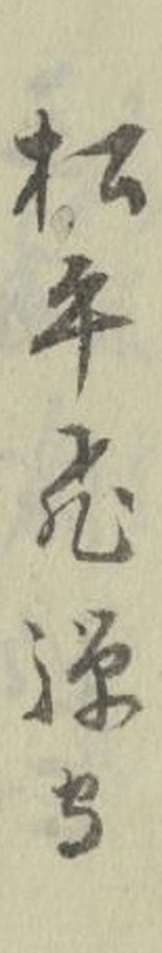同断松平飛騨守
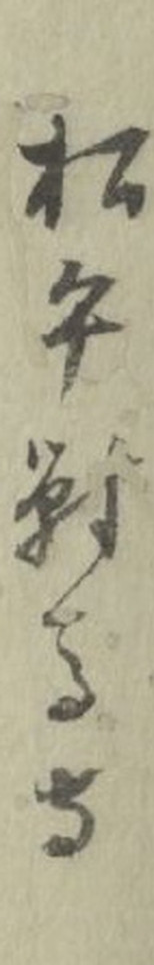同断松平対馬守
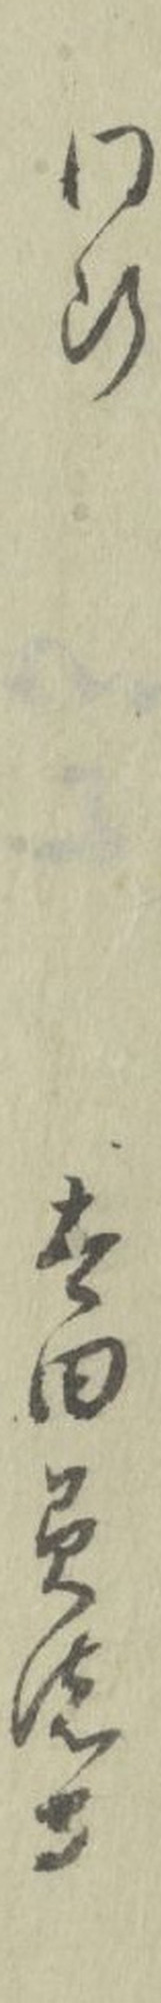同断太田美濃守
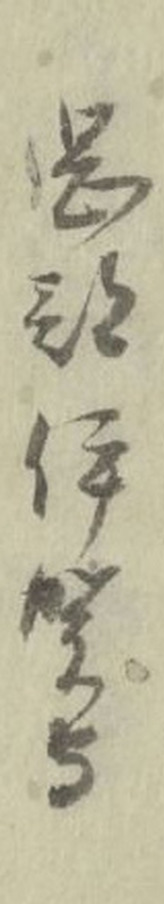同断岡部伊賀守
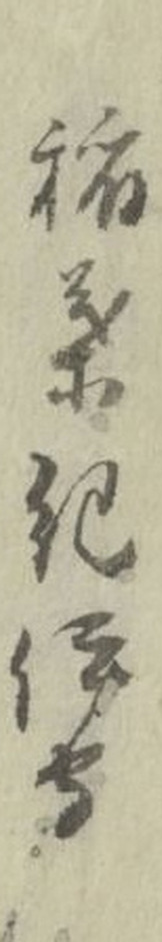同断稲葉紀伊守
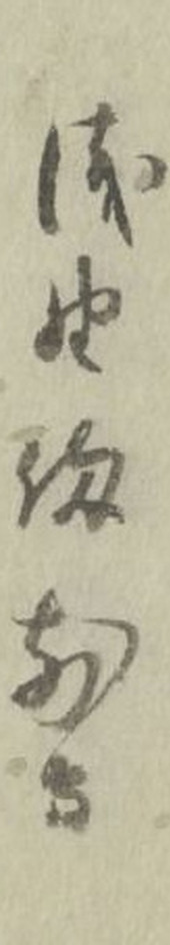同断浅野備前守

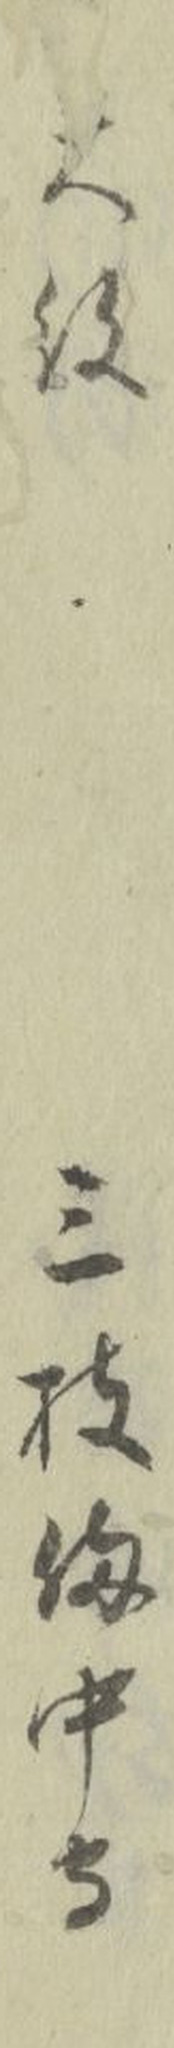大紋三枝備中守
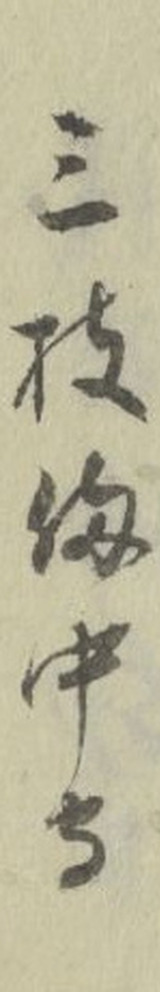大紋三枝備中守
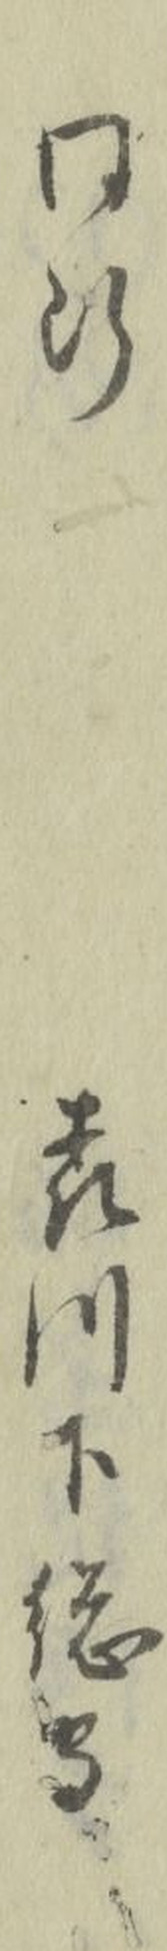同断吉川下総守
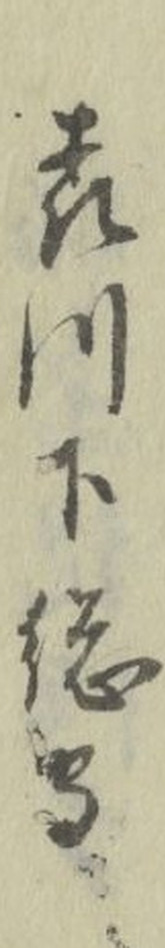同断吉川下総守
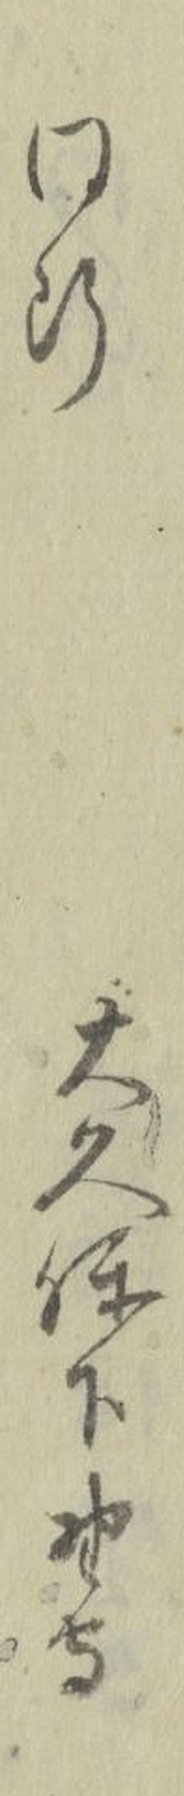同断大久保下野守
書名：琉球来朝記 自一至七
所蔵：University of the Ryukyus Library
